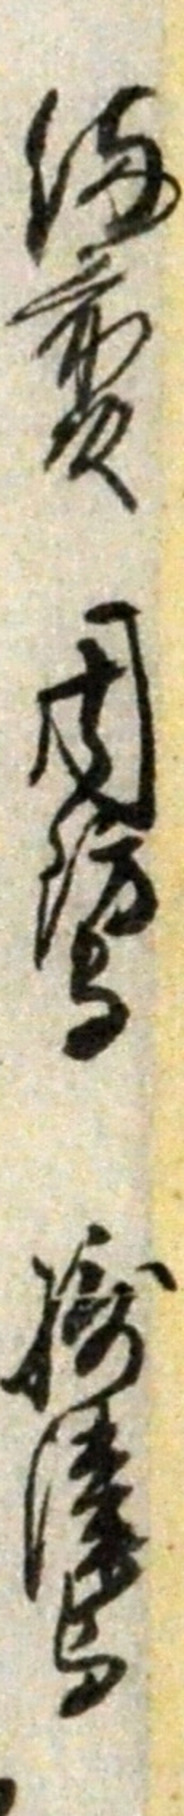備前殿周防守攝津守
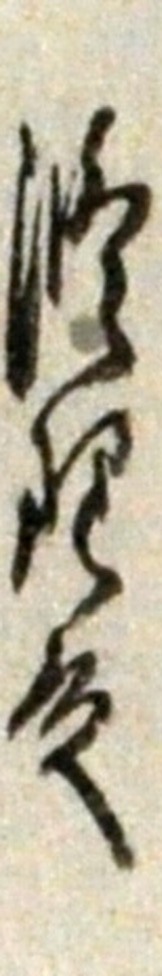修理殿
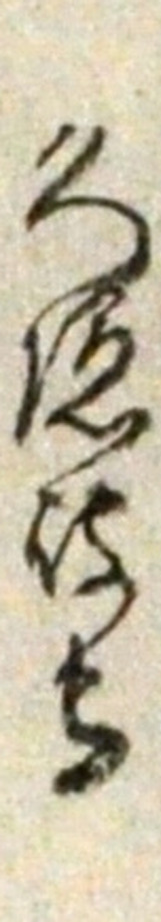久隠岐守
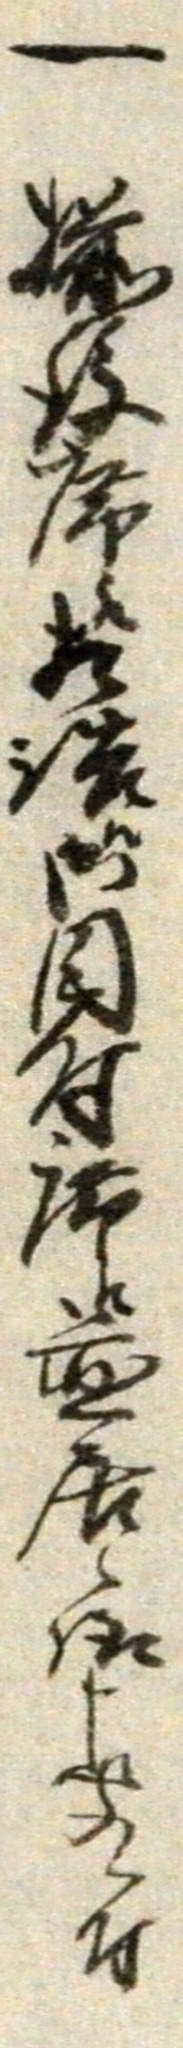一揃後席え相詰候御目付席え並居候様申聞候付
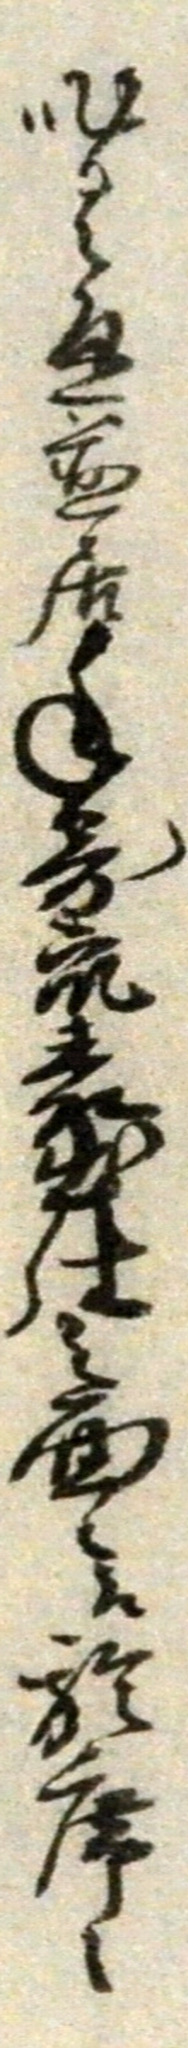昨日之通並居年寄衆表出仕之面々え於席之
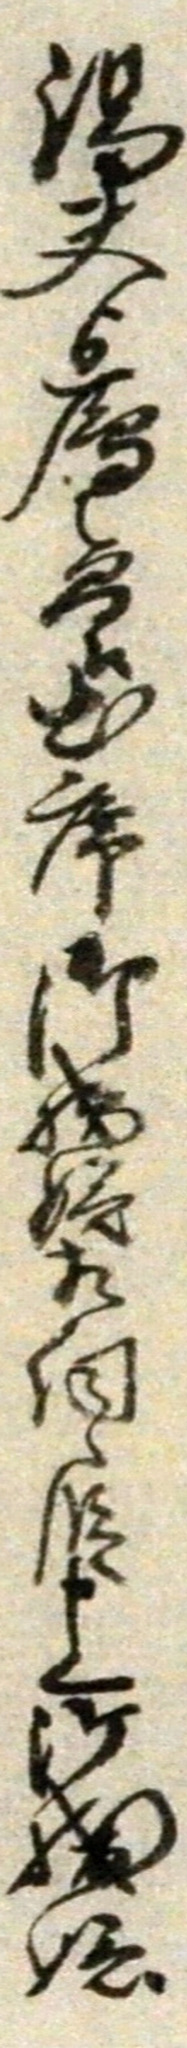謁夫ゟ雁之間え出席御機嫌相伺候段申上御機嫌
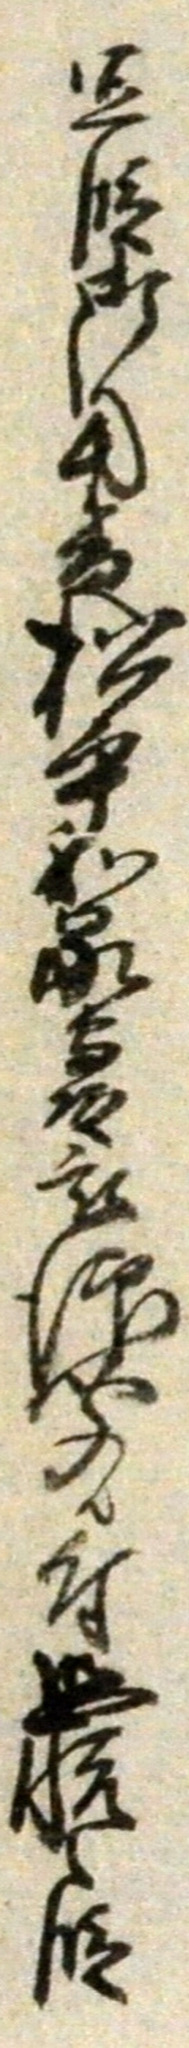宜段御用番松平和泉守殿被仰聞候付恐悦之段
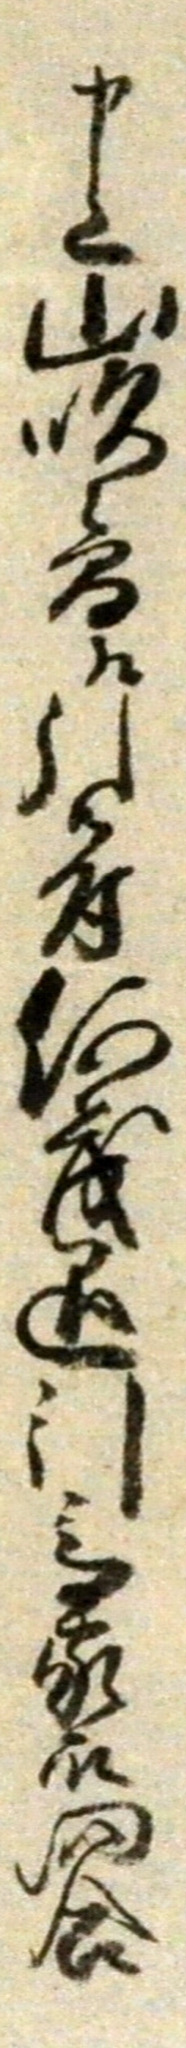申上山吹之間え引候付何も退引高家衆問合
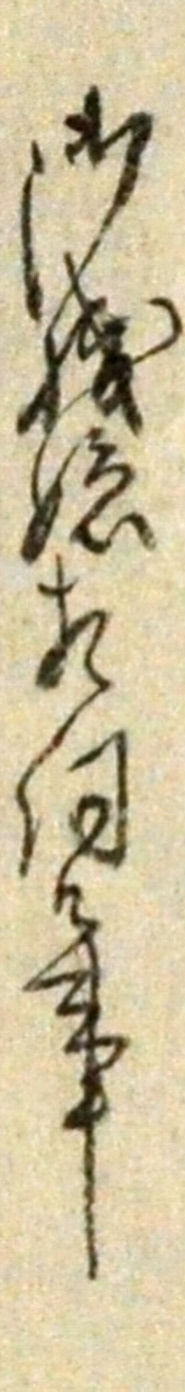御機嫌相伺候事
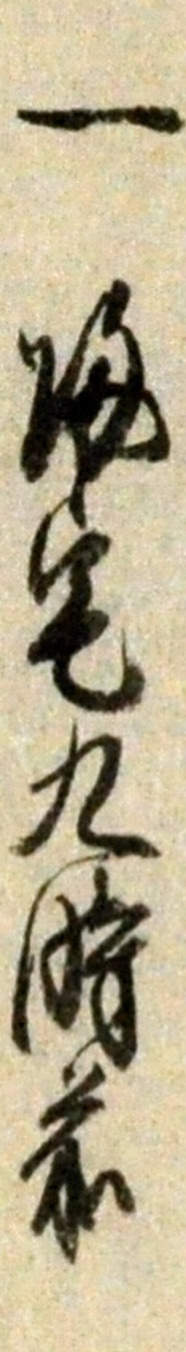一帰宅九時前
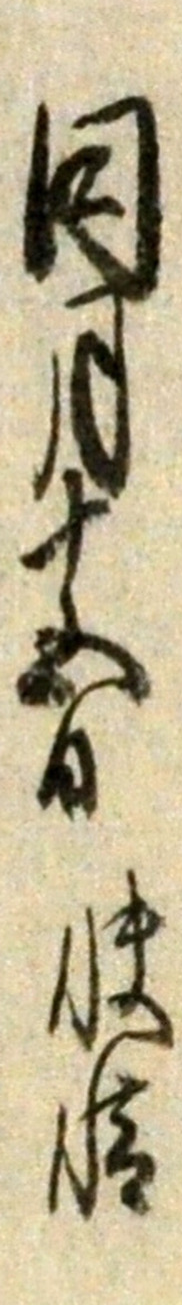同月十五日快晴
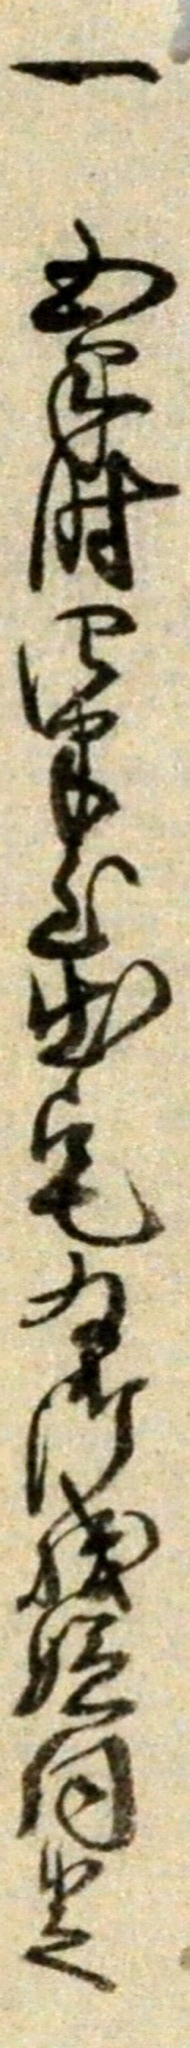一五半時四半至出宅為御機嫌伺登
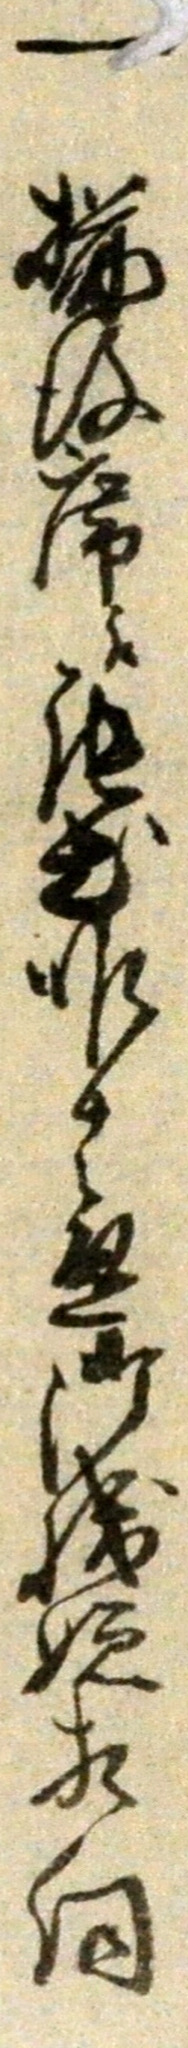一揃後席え罷出昨日之通御機嫌相伺
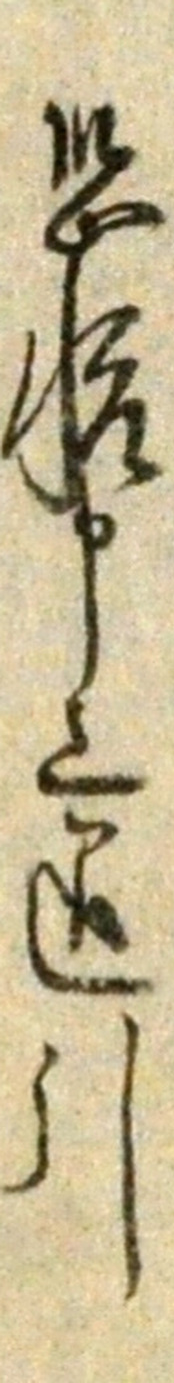恐悦申上退引
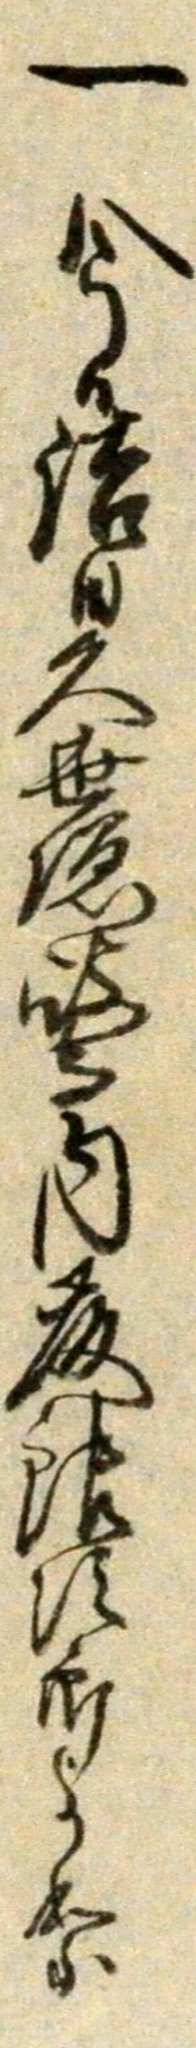一今日詰日久世隠岐守内藤銀次郎より
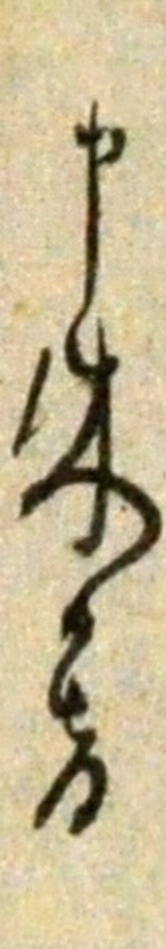申来候旨
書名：若君様（家斉嫡男）誕生諸祝儀ノ節ノ留書外
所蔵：伊那市立高遠町図書館・合同会社AMANE
